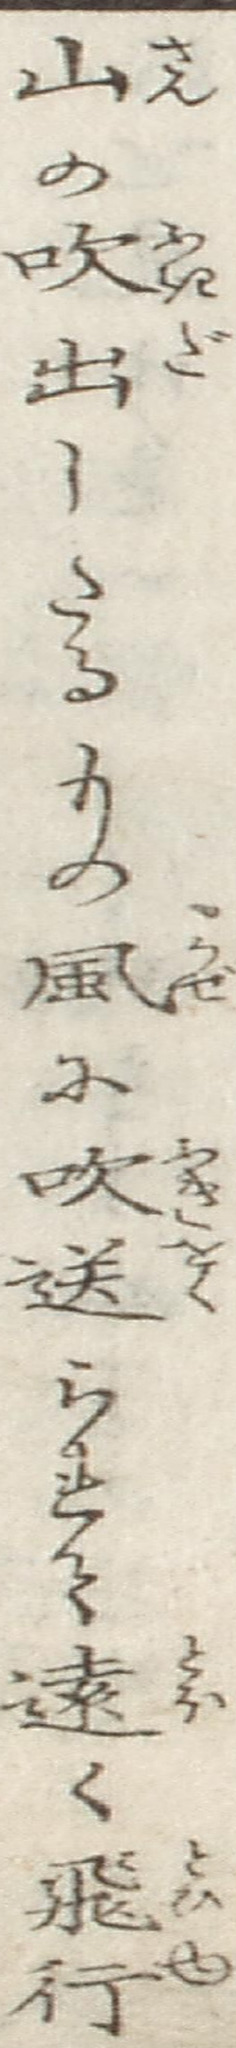山の吹出したるもの、風に吹送られて遠く飛行
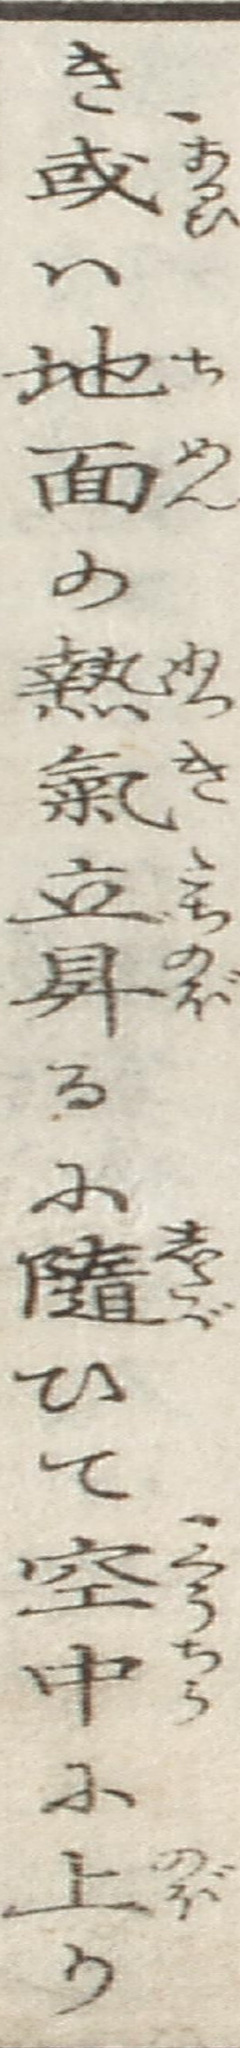き、或は地面の熱気立昇るに随ひて、空中に上り

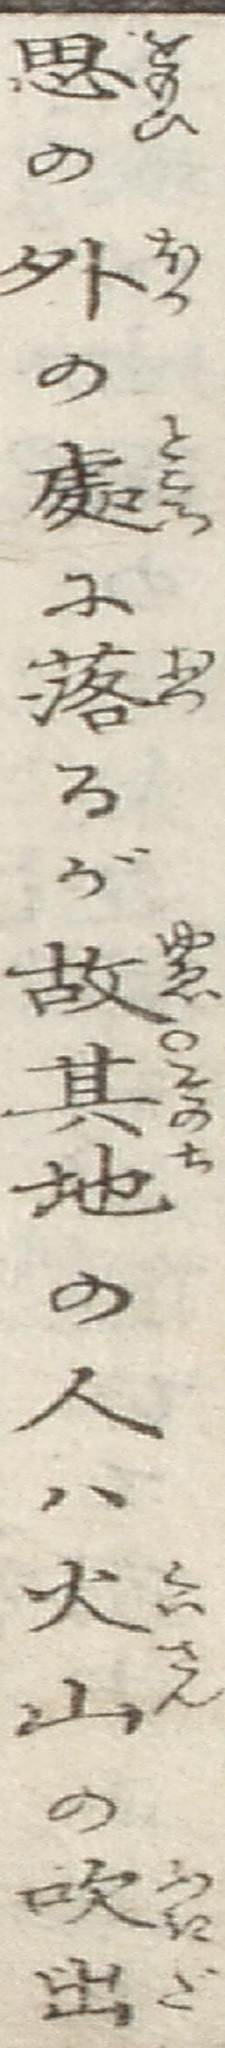思の外の処に落るが故。其地の人は火山の吹出
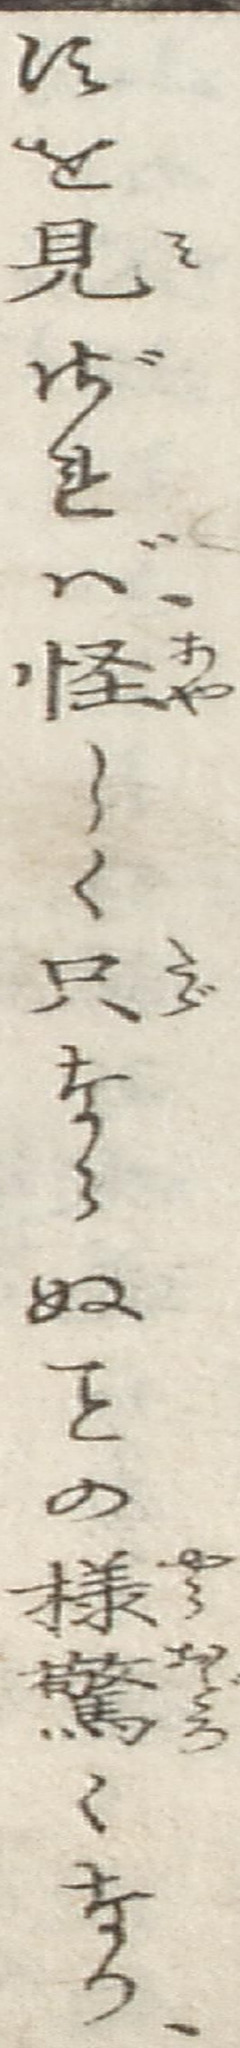すを見ざれば、怪しく只ならぬことの様驚くなり、
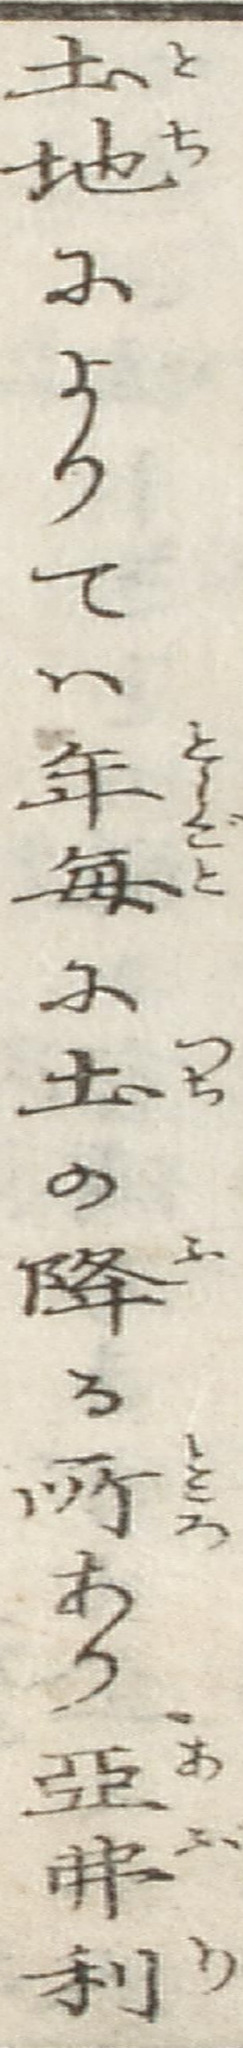土地によりては年毎に土の降る所あり、亜弗利
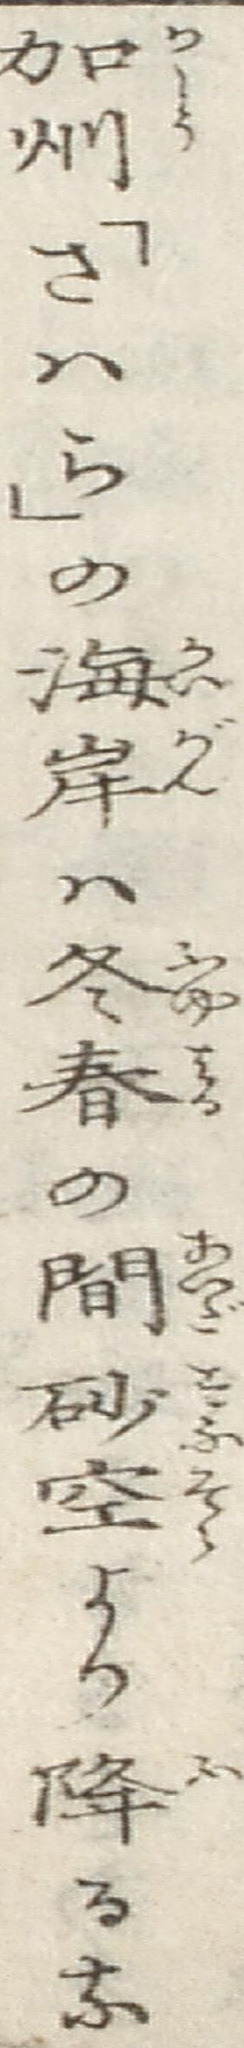加州「さはら」の海岸は冬春の間砂空より降るな
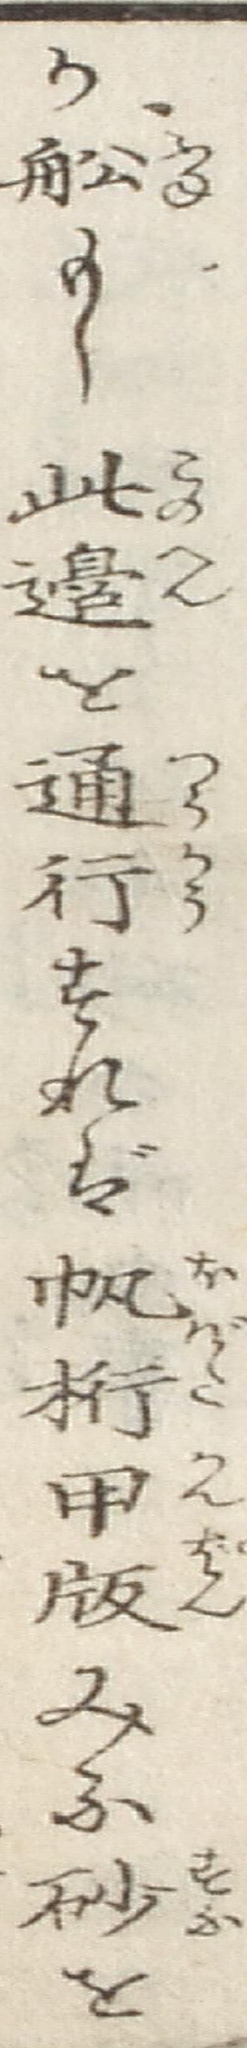り、船もし此辺を通行すれば帆桁甲板みな砂を
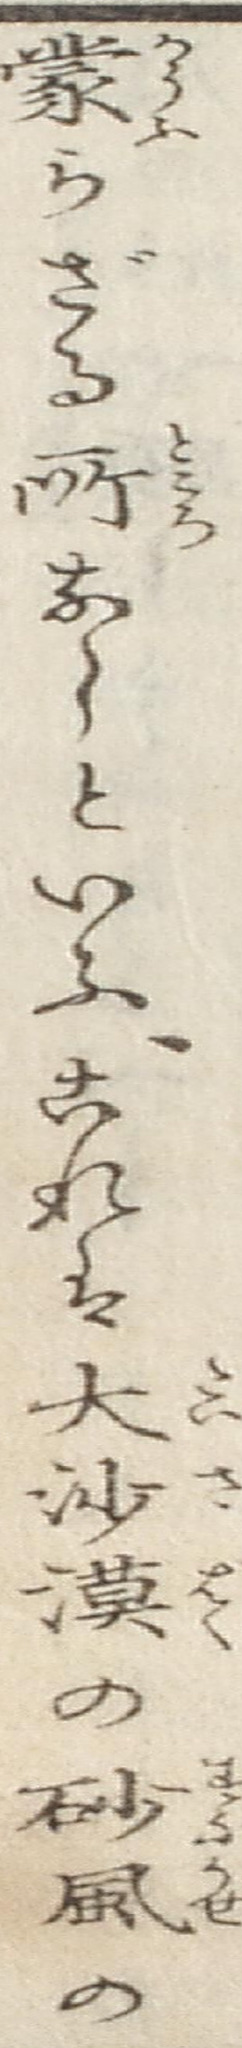蒙らざる所なしといふ、これは大沙漠の砂風の
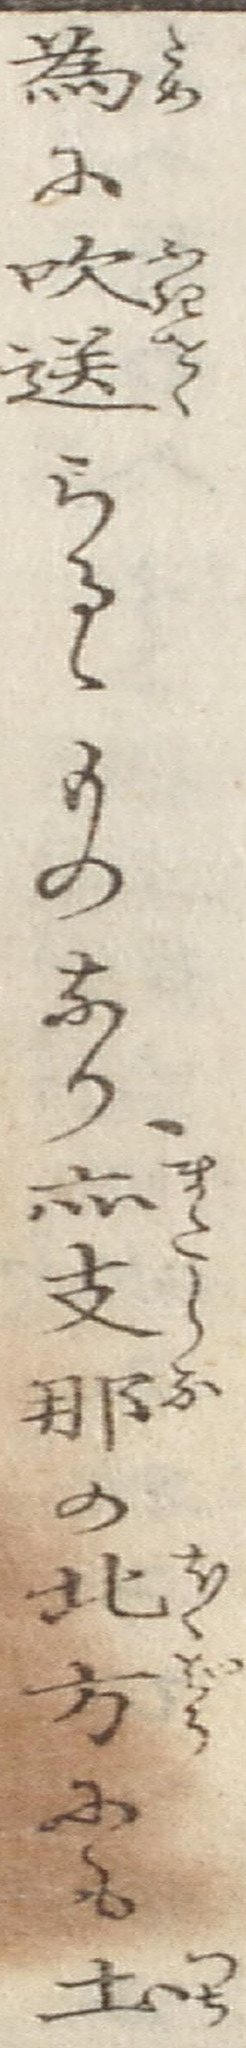為に吹送らるゝものなり、亦支那の北方にも土
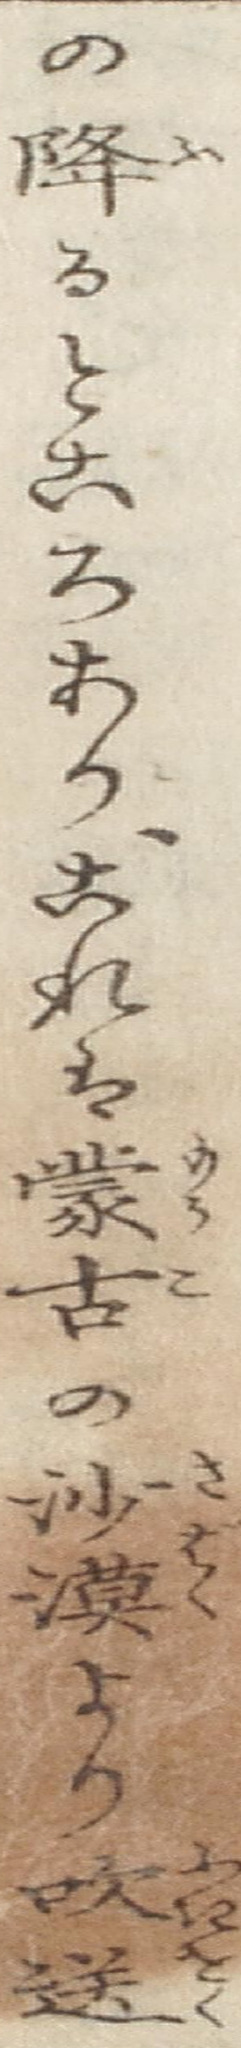の降るところあり、これは蒙古の沙漠より吹送
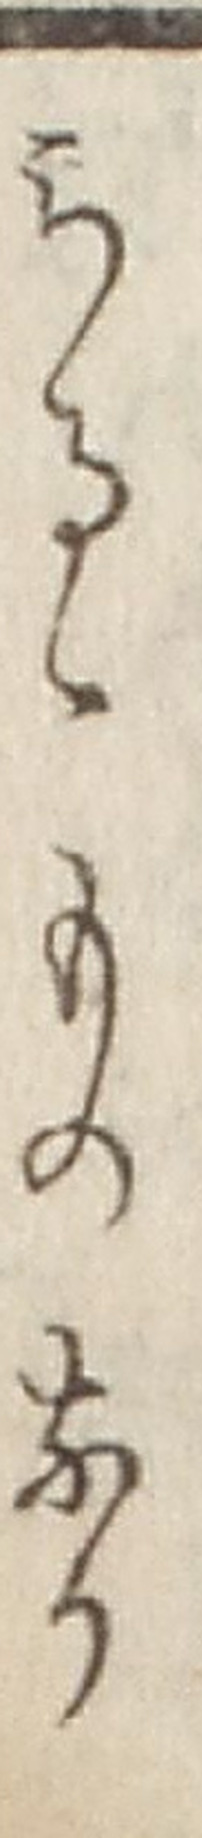らるゝものなり
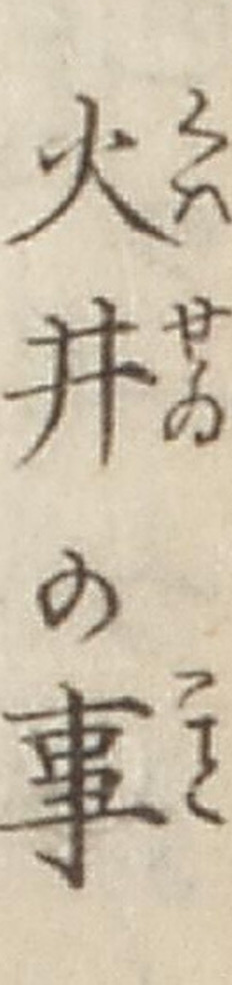火井の事
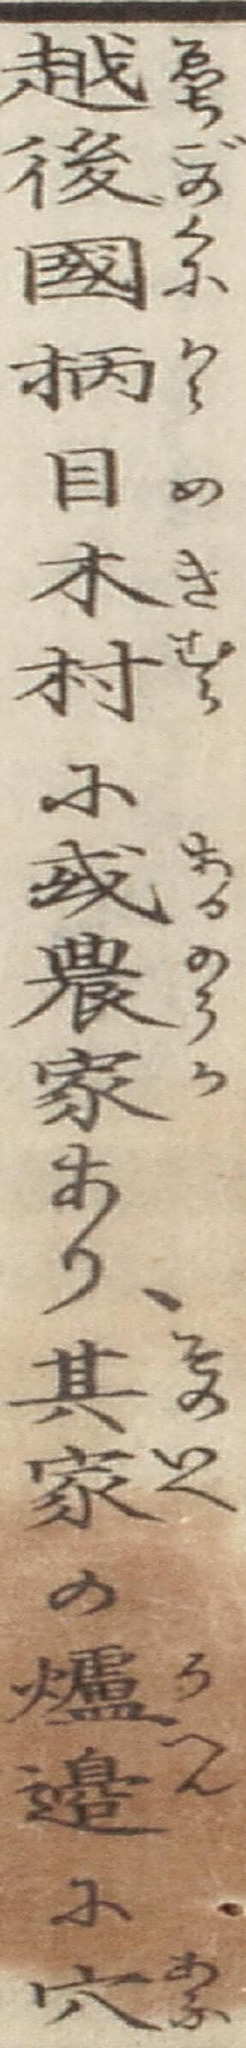越後国柄目木村に或農家あり、其家の炉辺に穴
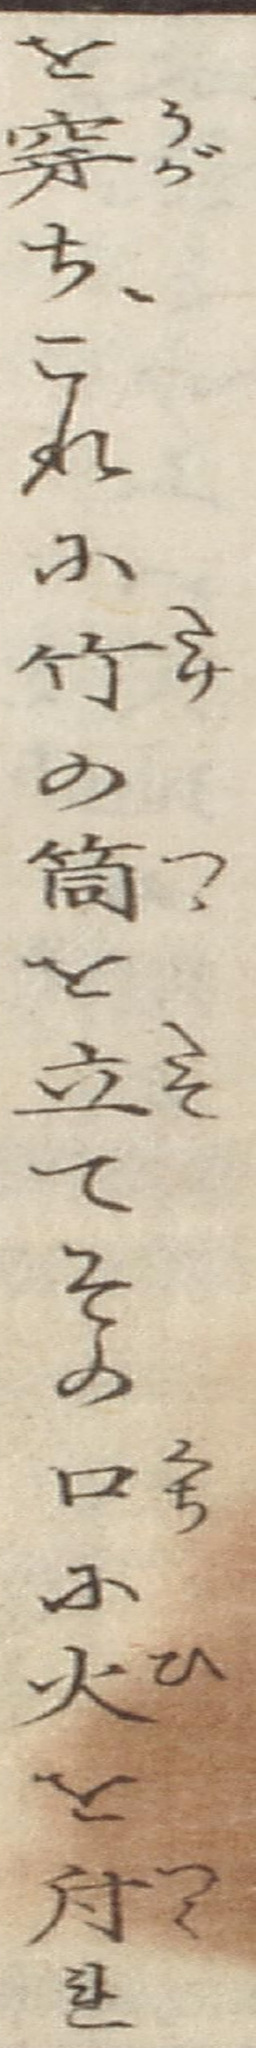を穿ち、これに竹の筒を立てその口に火を付れ
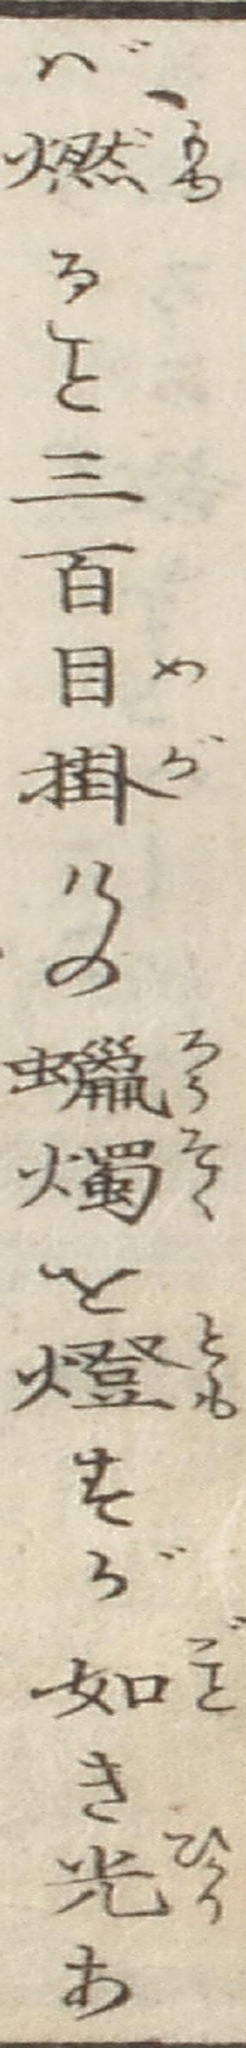ば、燃ること三百目掛けの蝋燭を燈すが如き光あ
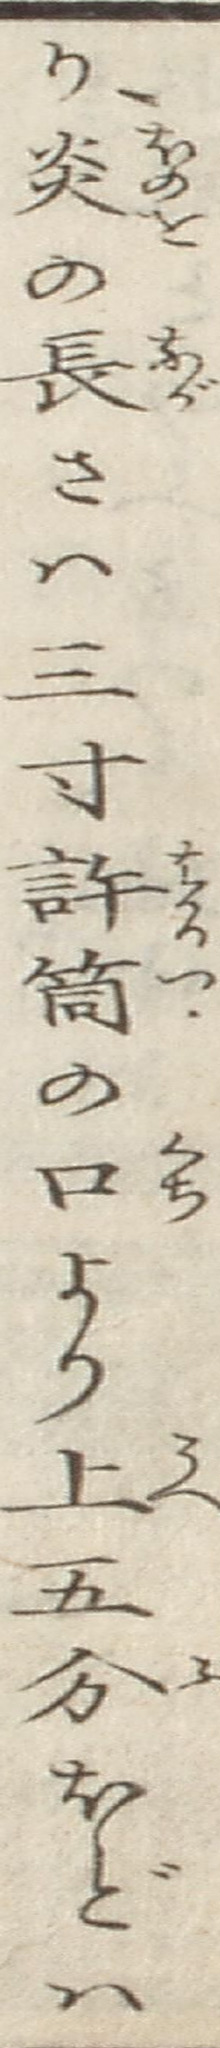り、炎の長さは三寸許、筒の口より上五分ほどは
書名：変異辯　一名、天變地異拾遺　全
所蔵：東京大学地震研究所図書室 Earthquake Research Institute Library, The University of Tokyo, JAPAN
